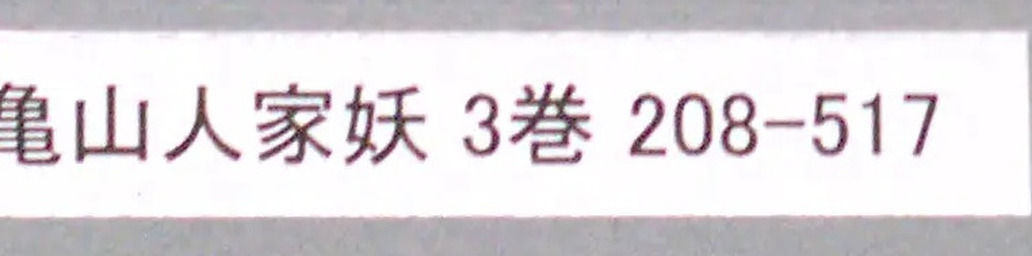亀山人家の妖完
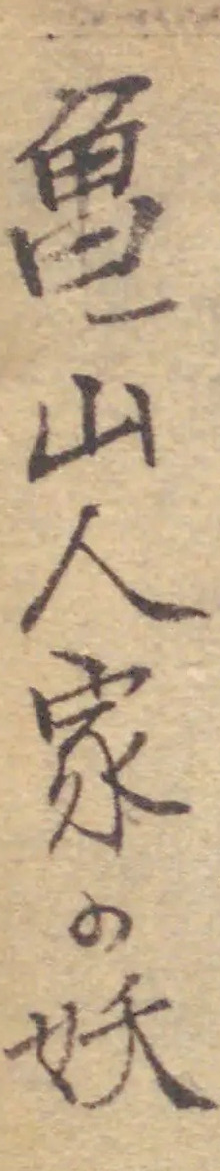亀山人家の妖完

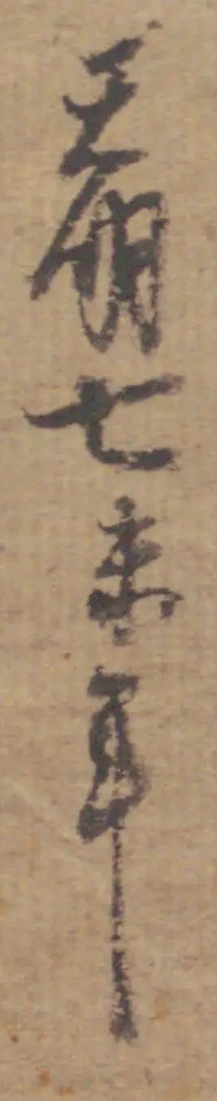天明七未年
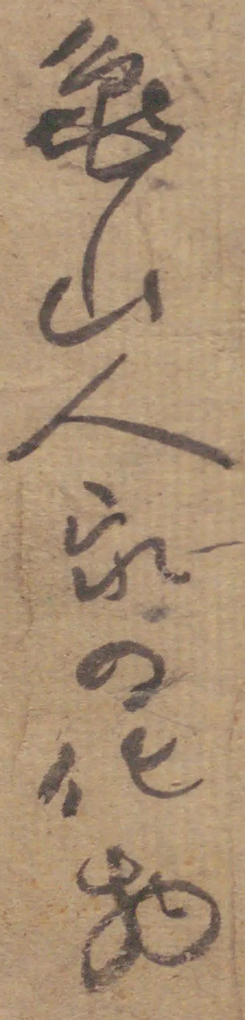亀山人家の化物

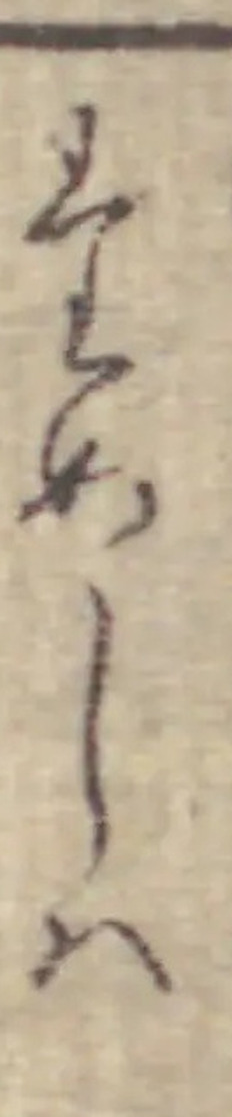ためしは
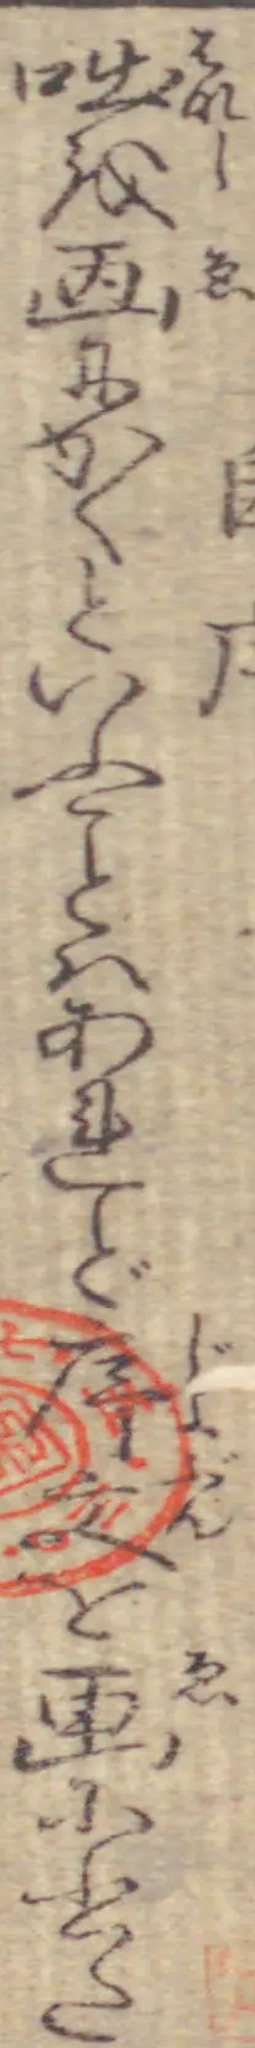咄を画にかくといふことはあれど序文を画に書た
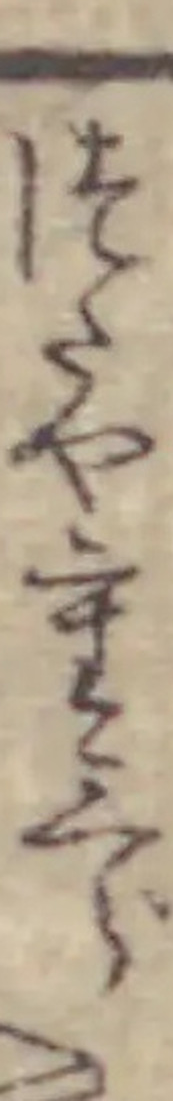つたや重三郎
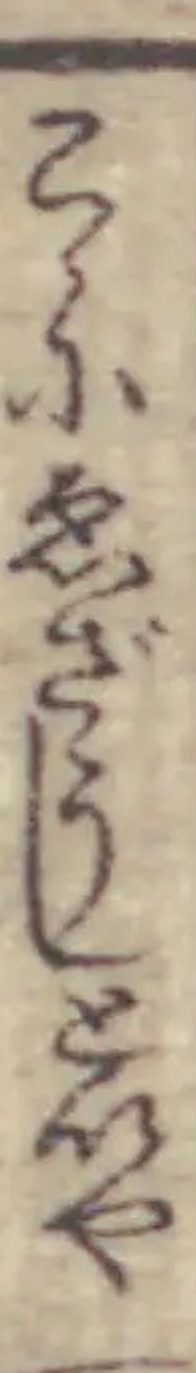こゝにゑざうしといや
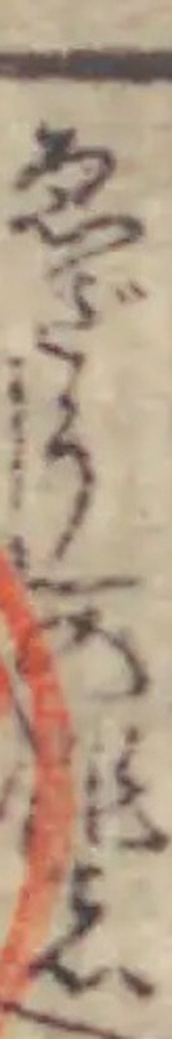ゑざうしの作者
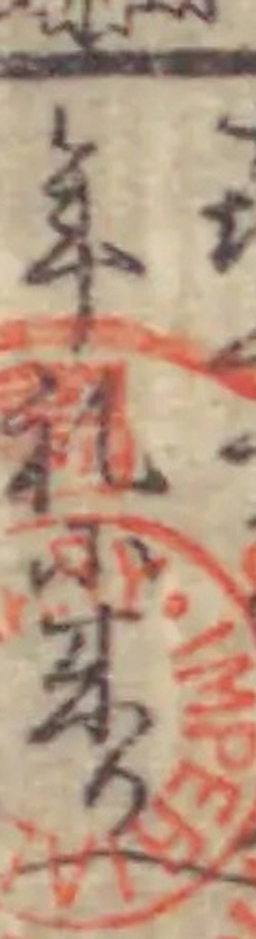年礼に来り
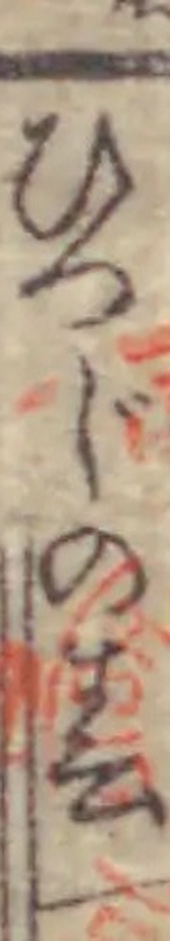ひつじの春
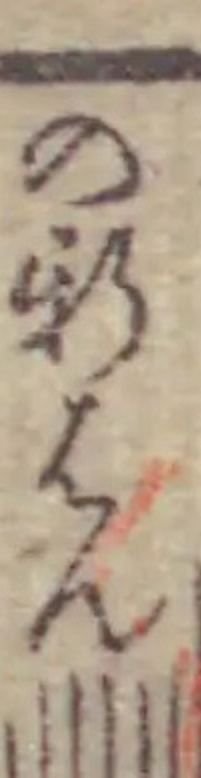の新はん
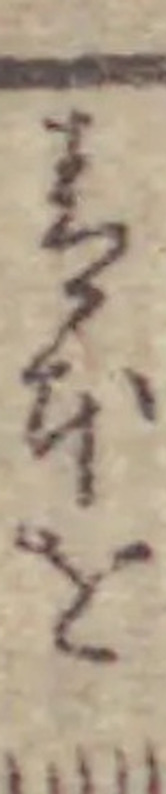青本を
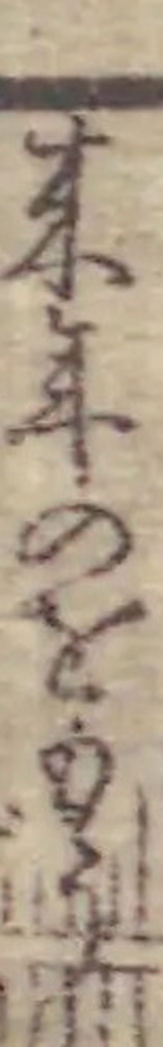来年のをもう
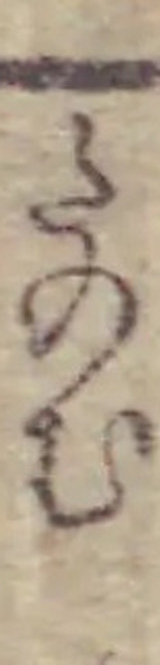たのむ
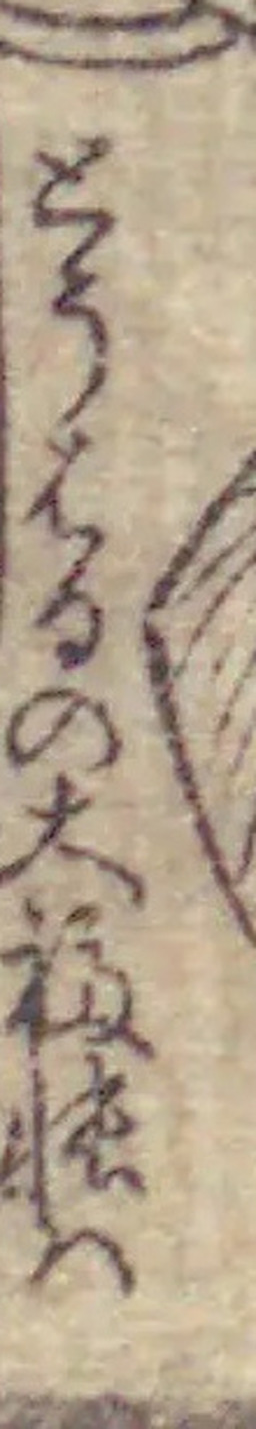とうはるの大福帳は
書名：亀山人家妖 3巻
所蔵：国立国会図書館 National Diet Library, JAPAN
